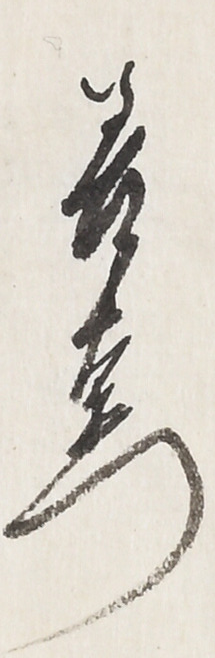善右衛門
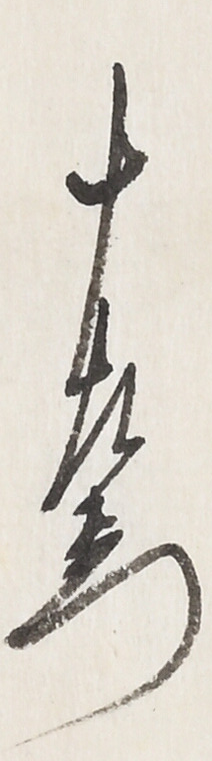七左衛門
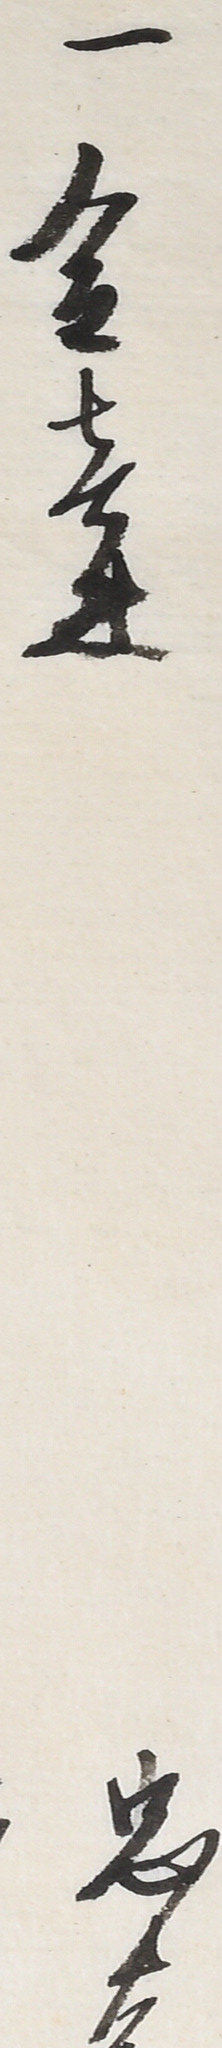一金壱朱忠右衛門
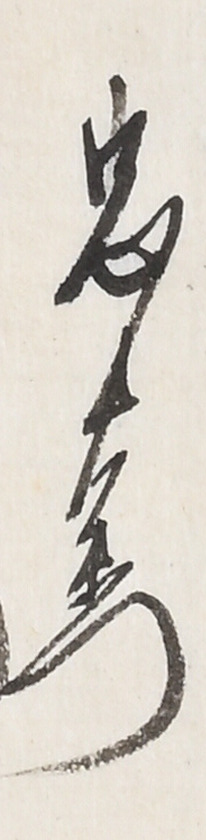兵右衛門
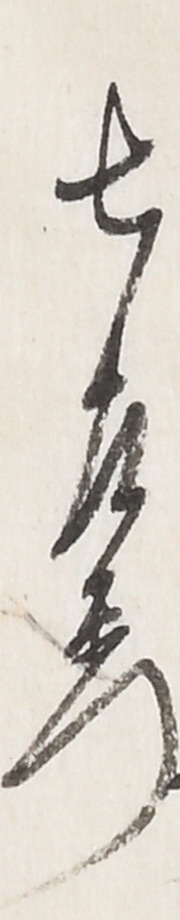七左衛門
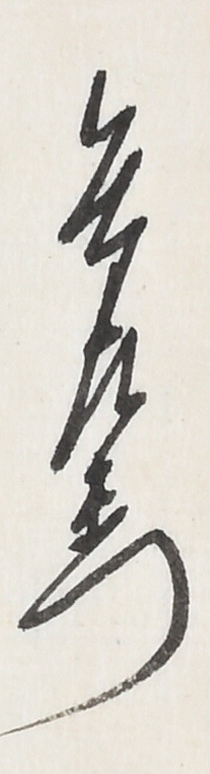七左衛門
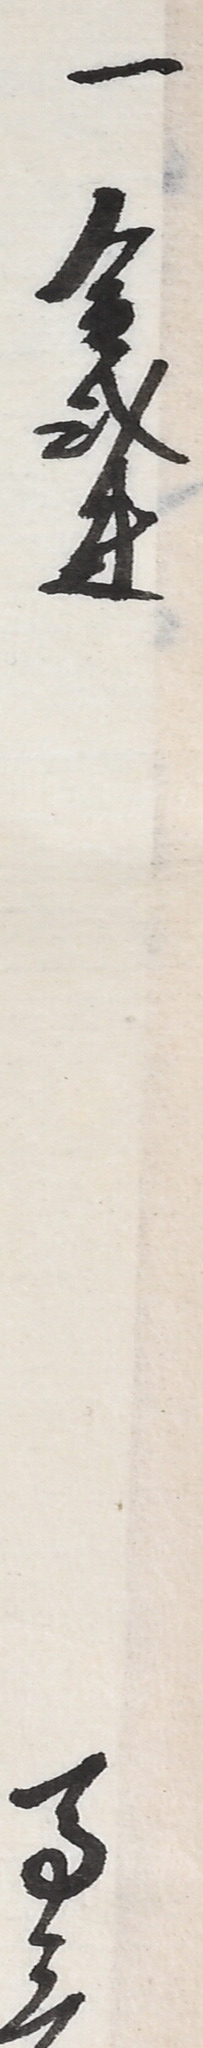一金弐朱事三郎
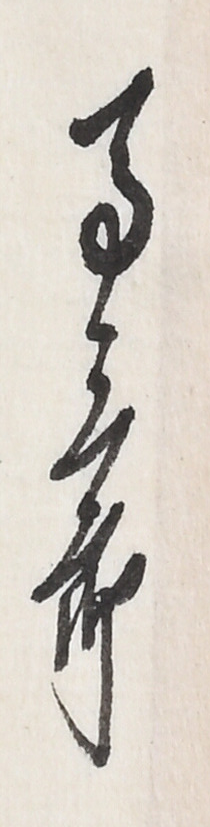兵三郎
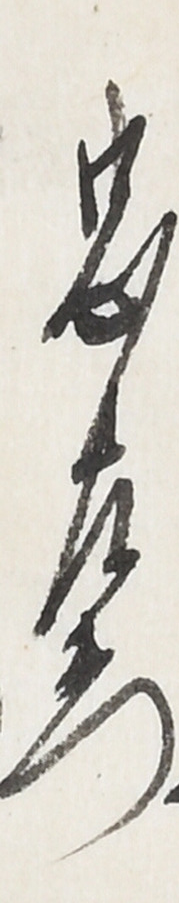七左衛門
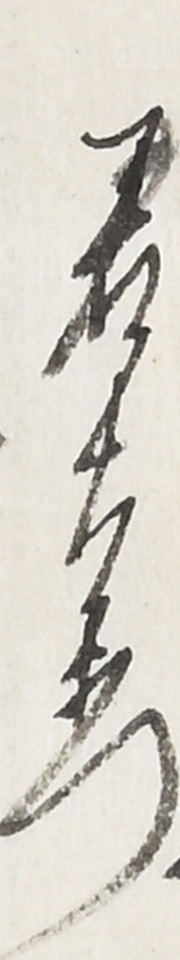善右衛門
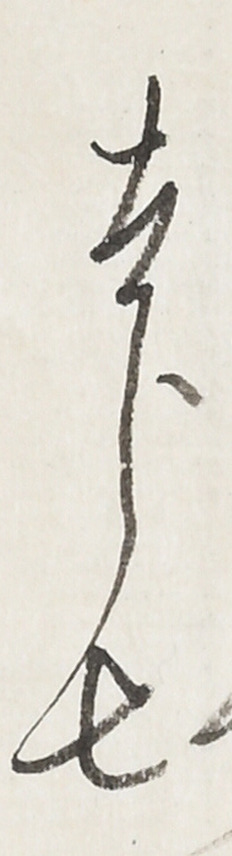太郎七
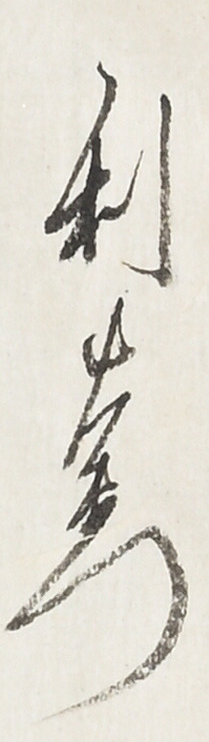兵右衛門
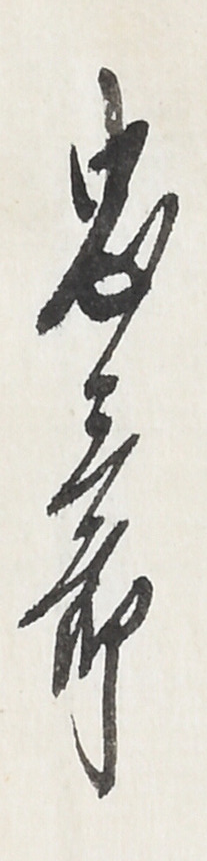兵三郎

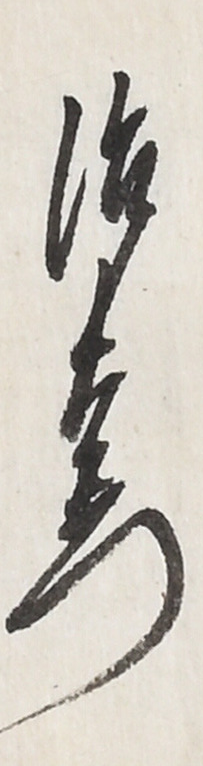治右衛門
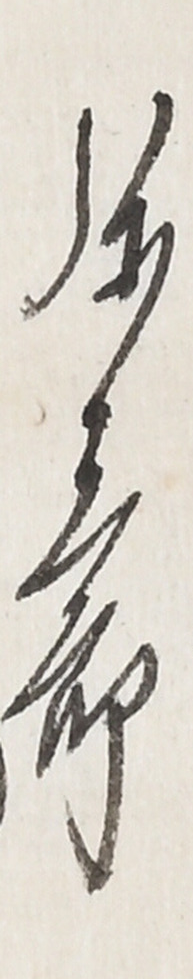弥三郎
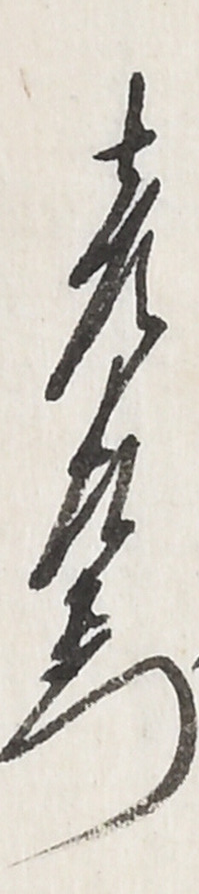彦左衛門
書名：御拝地百五拾年御祝儀献上御目録名前
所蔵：伊那市立高遠町図書館・合同会社AMANE
